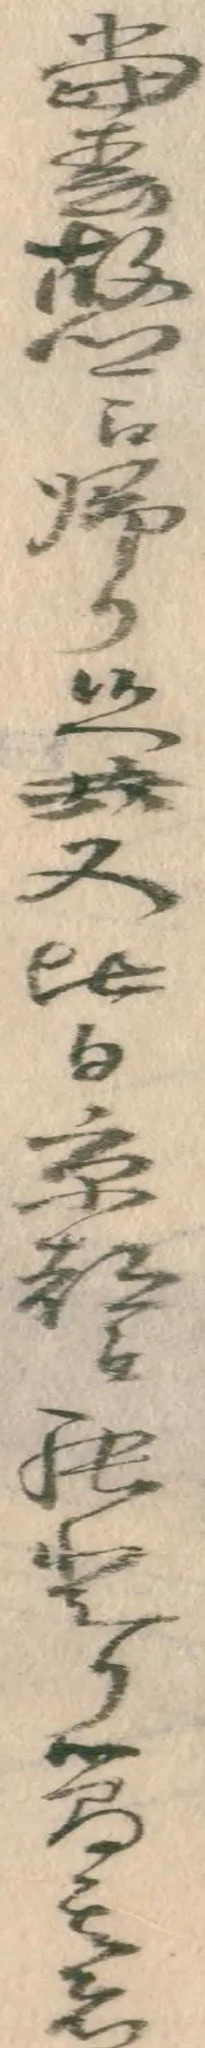当春故郷江帰り候へ共又比日京都江罷登り候間其者
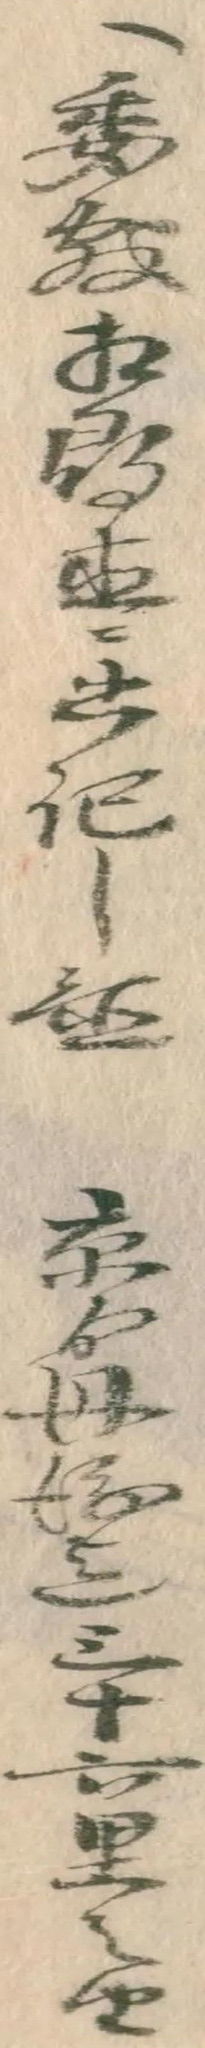へ委敷相尋直々書記し置京ゟ丹後迄三拾六里之由
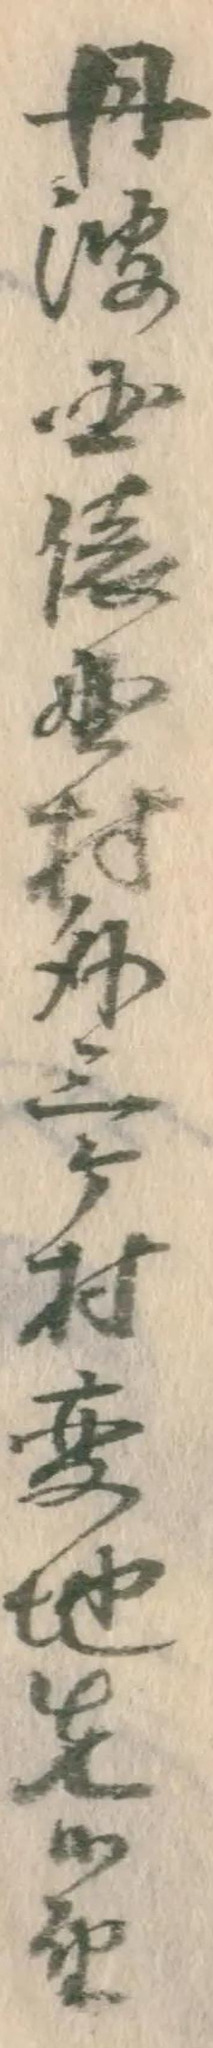丹波国俵野村外三ヶ村変地先御届
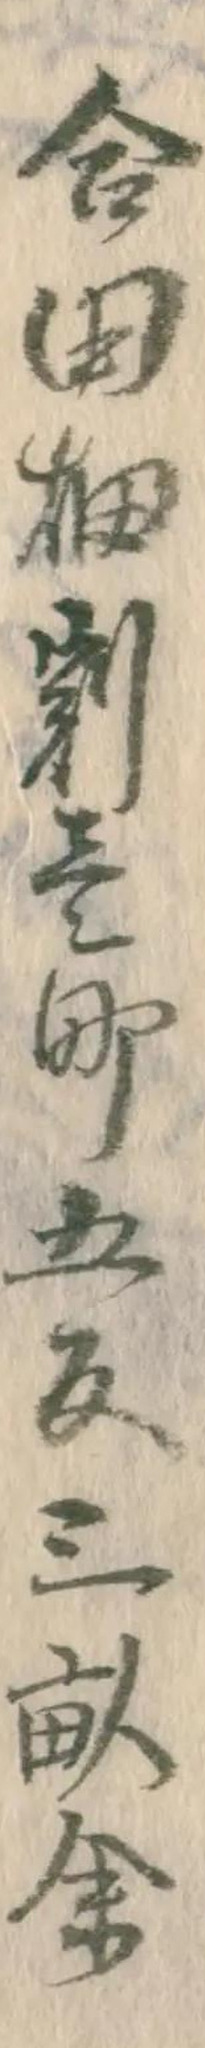合田畑割壱町五反三畝余
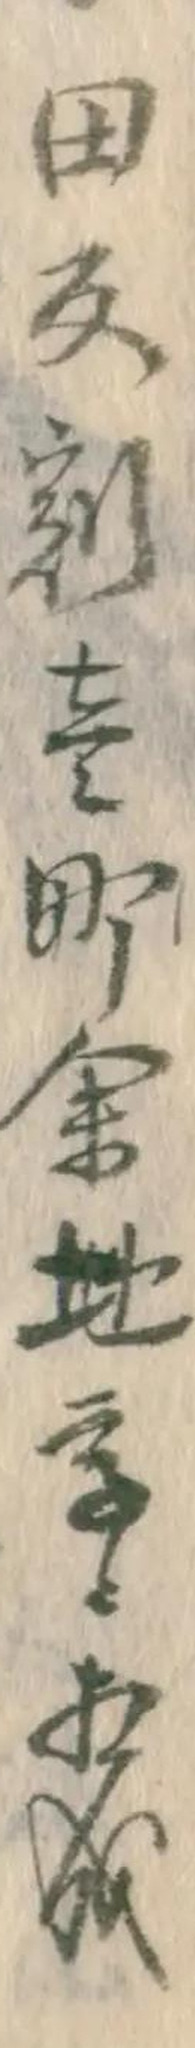内田反割壱町余地変相成
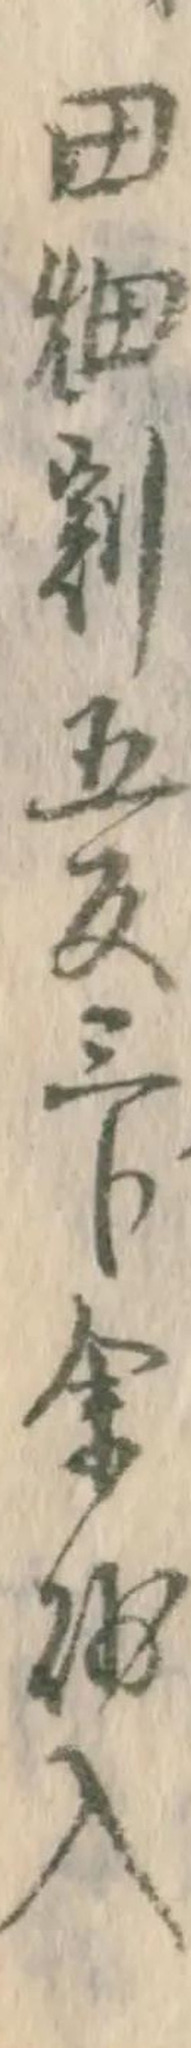田畑五反三部余砂入

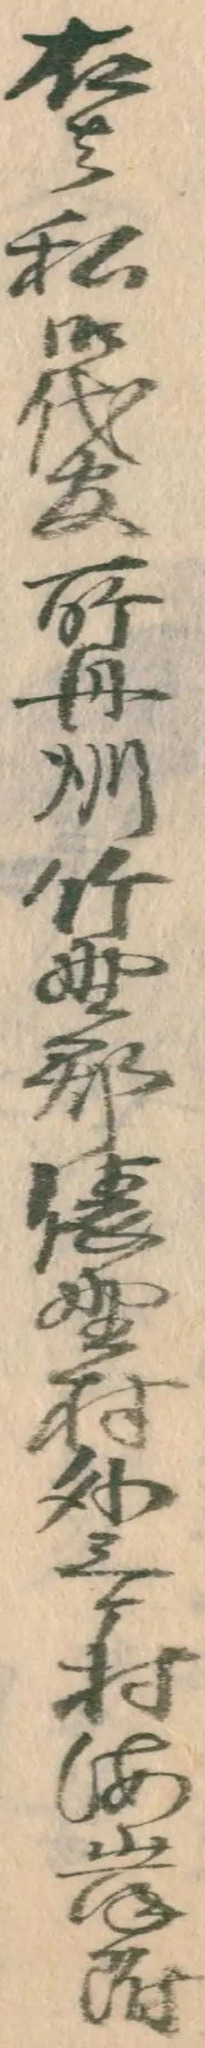右者私御代官所丹州竹野郡俵野村外三ヶ村海岸附
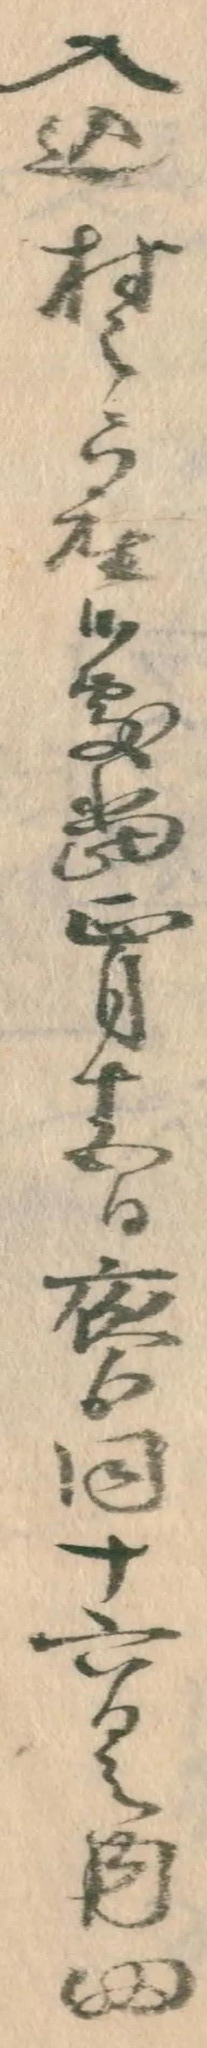入込村々二御座候処当正月十五日夜ゟ同十六日之内田
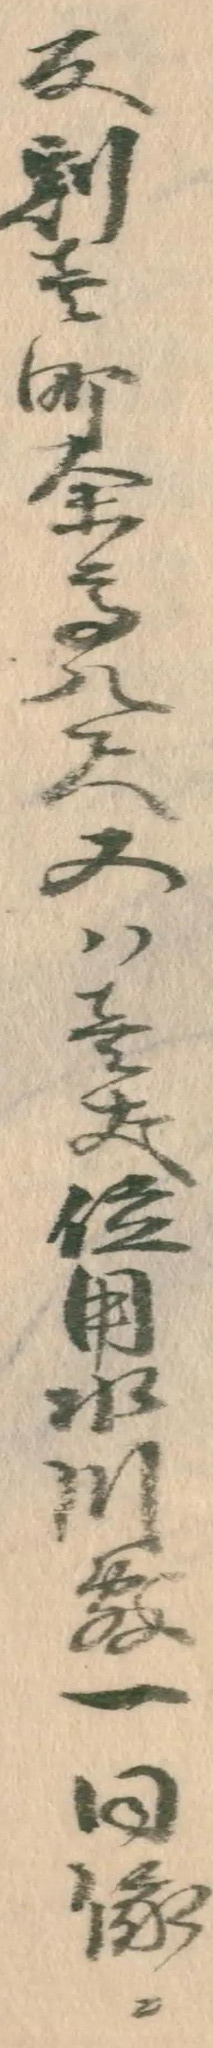反割壱町余高八尺又ハ壱丈位用水川敷一同俄二
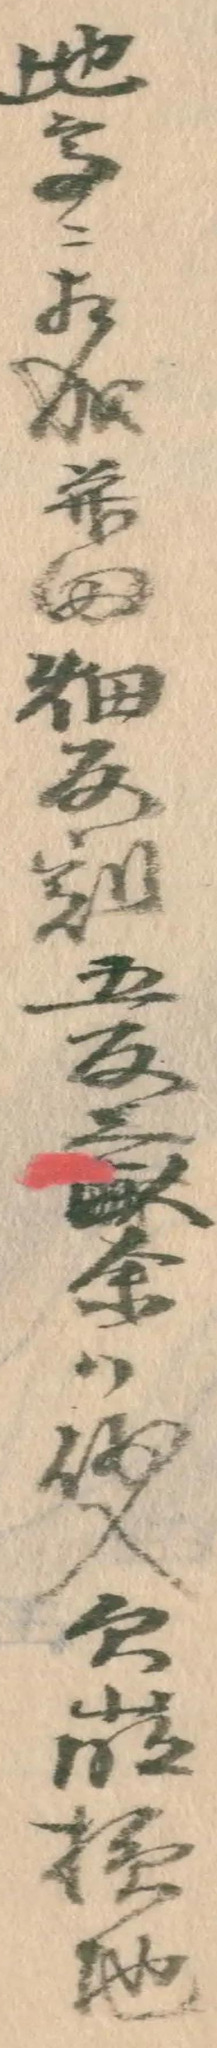地高二相成并田畑反別五反三畝余ハ砂入欠崩損地
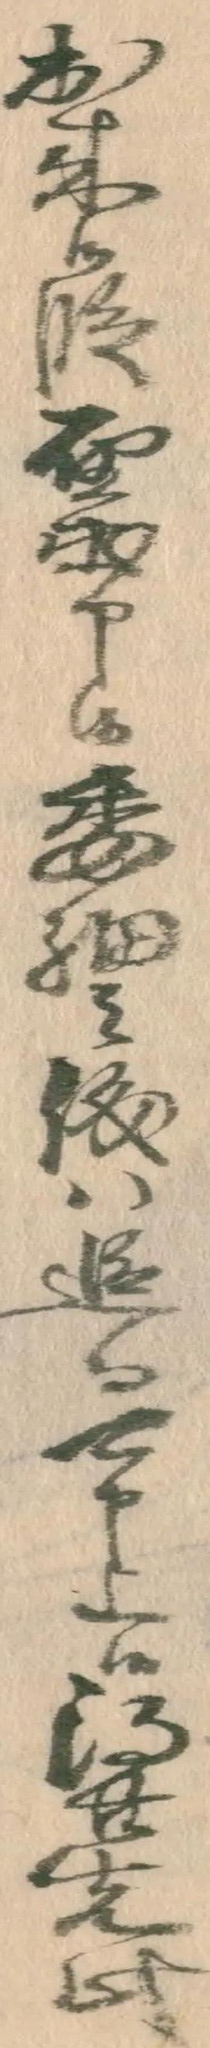出来候段届出申候委細之儀ハ追而可申上候得共先此
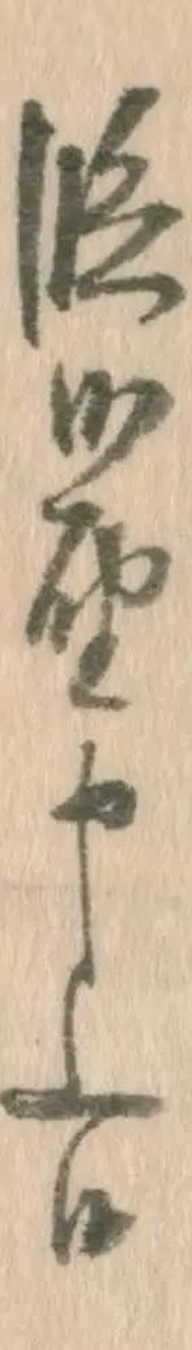段御届申上候
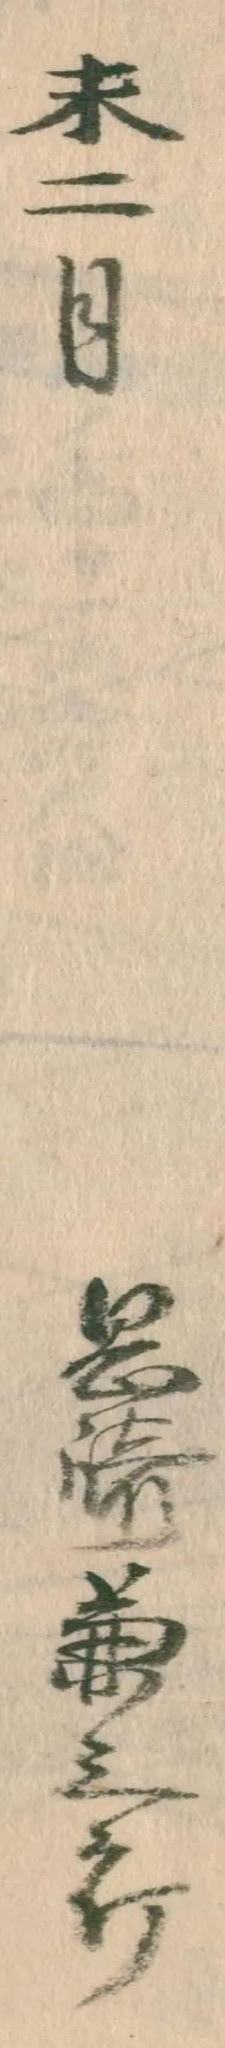未二月岡崎兼三郎
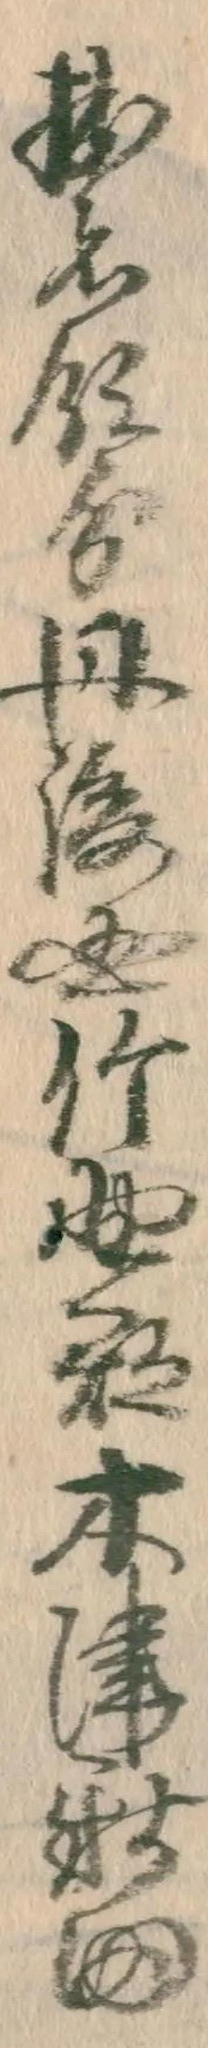拙者領分丹後国竹野郡木津荘内
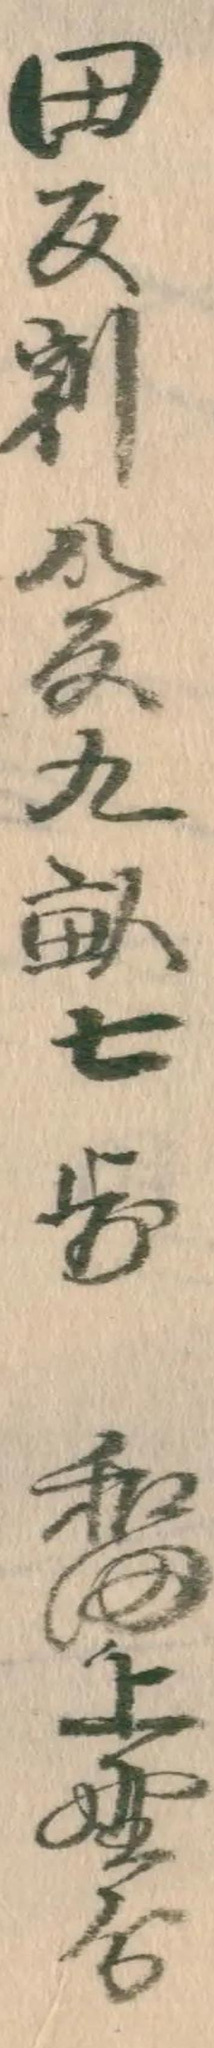田反割八反九畝七歩和田上野分
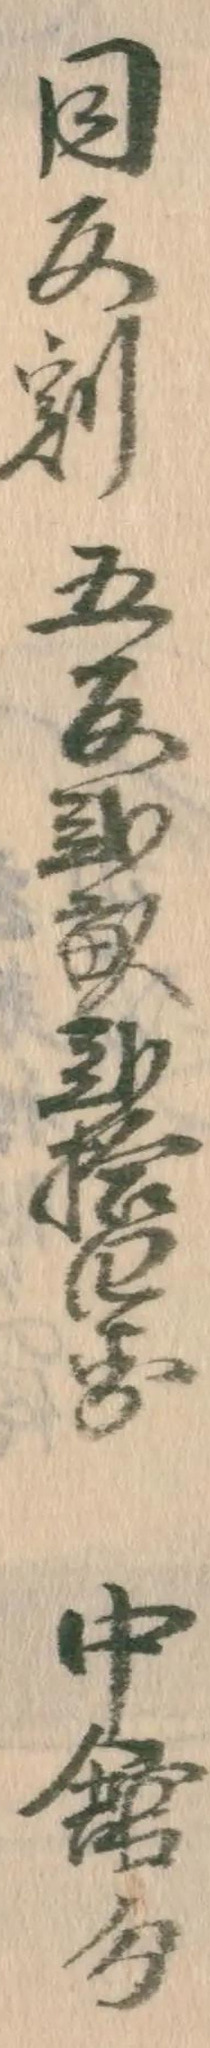田反割五反弐畝弐拾四歩中館分
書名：信州大地震之記
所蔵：国立国会図書館 National Diet Library, JAPAN
